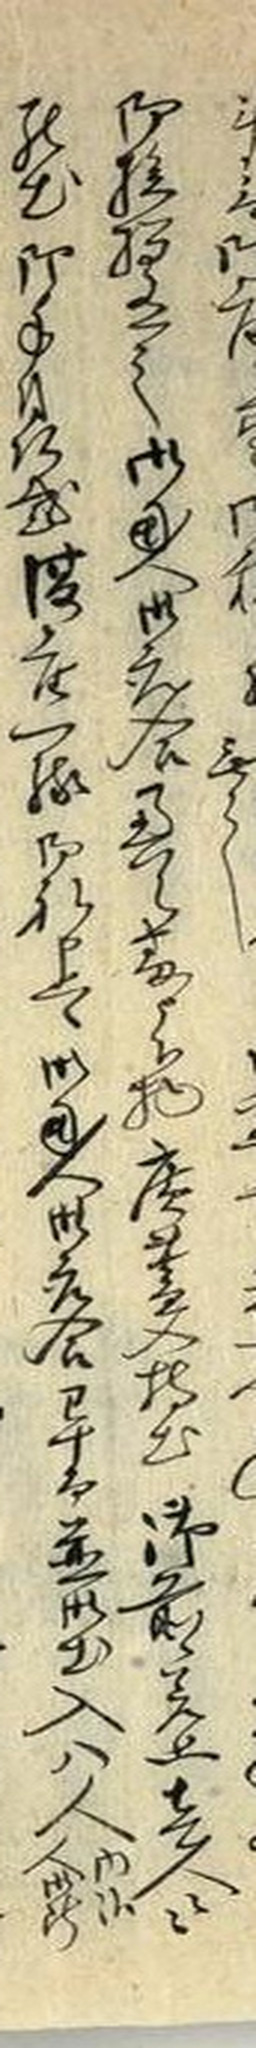罷出御手自頂戴復座一統御礼申上候御用人御取合畢而並御出入八人内弐人御断
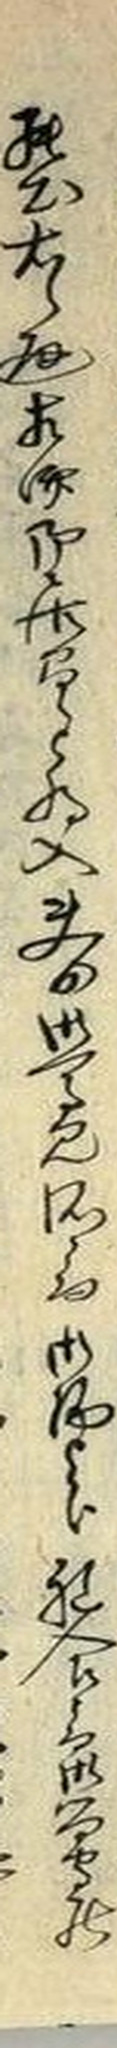罷出右之通相済御居間へ被為入夫ゟ御馬見所ニ而御酒被下程合ニ而御留守居
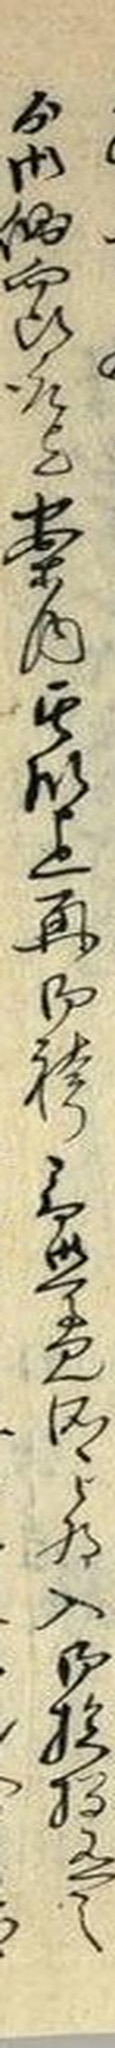ゟ御側向頭取迄案内其段申上再御袴ニ而御馬見所へ被為入御挨拶有之
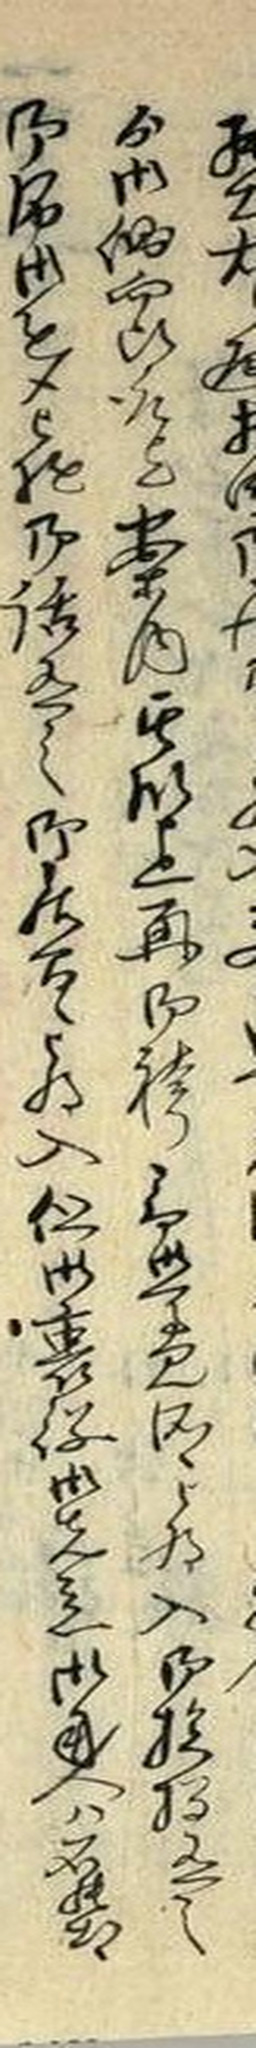御酒御進メ被遊御話有之御居間へ被為入但御裏役御先立御用人ハ不罷出候
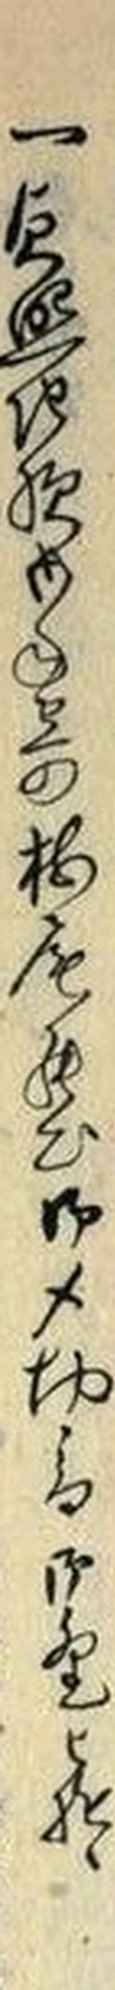一貞照院様御年寄梶尾罷出御〆切ニ而御逢被遊候
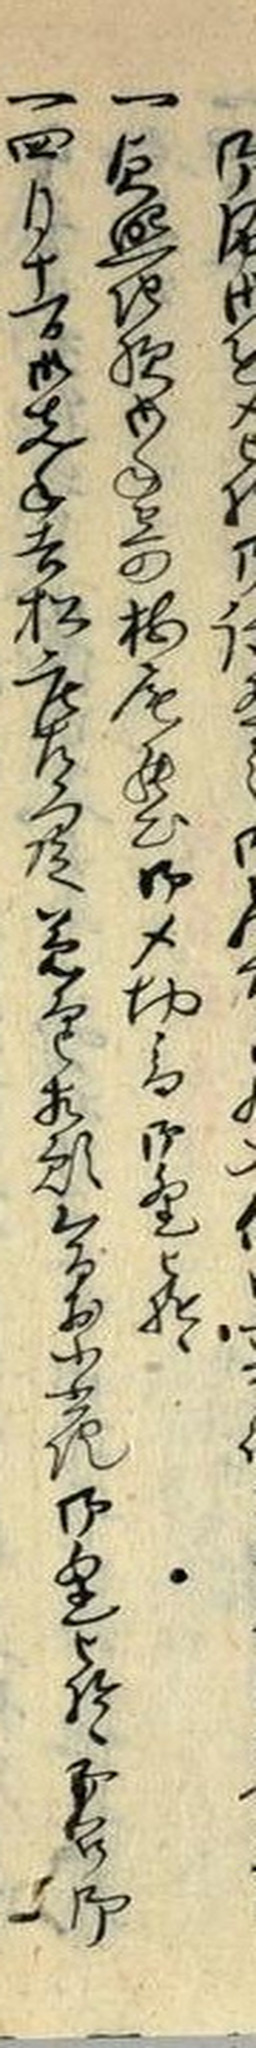一四月十一日御先手吉松庄左衛門殿兼而被相願今日於小書院御逢被遊候御召御
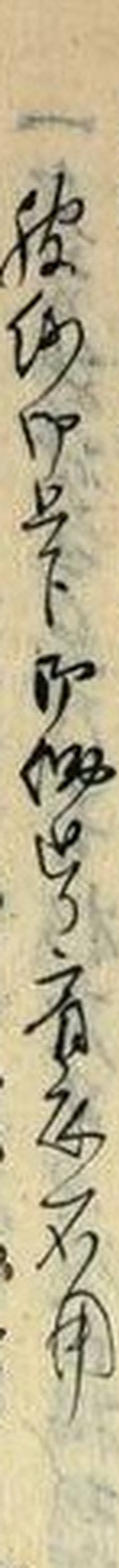服紗御上下御側廻り肩衣不用
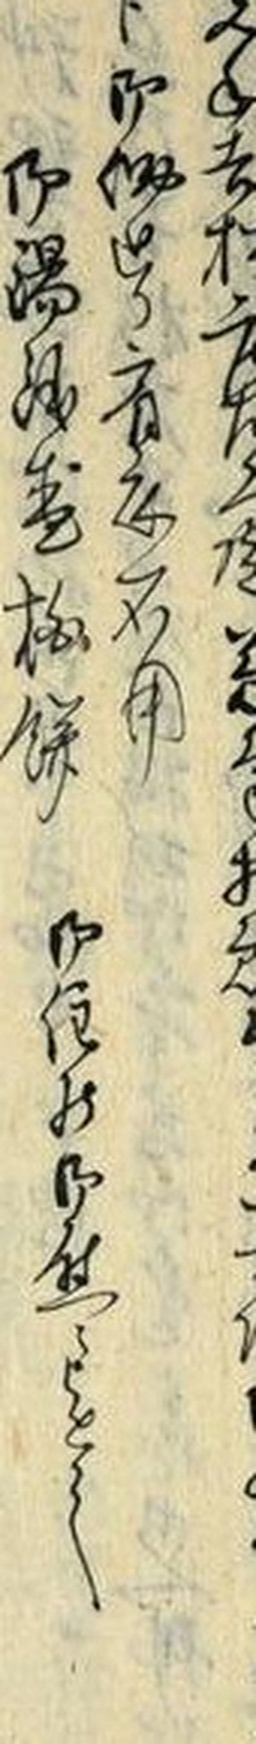御錫鉢盛柏餅御住居御慰ニ被進之
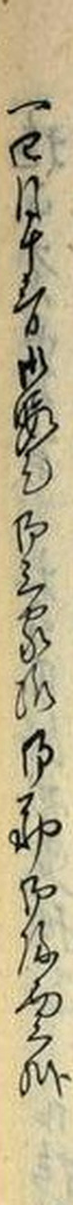一四月十三日御暇乞御三家様御勤御帰殿掛
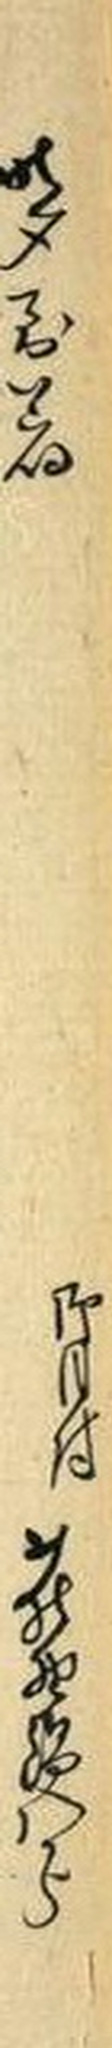昨夕到着御目付荻野鍋八郎
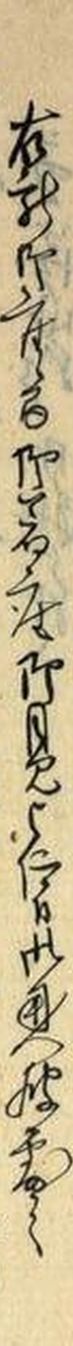右新御座之間御着座御目見被仰付御用人披露之
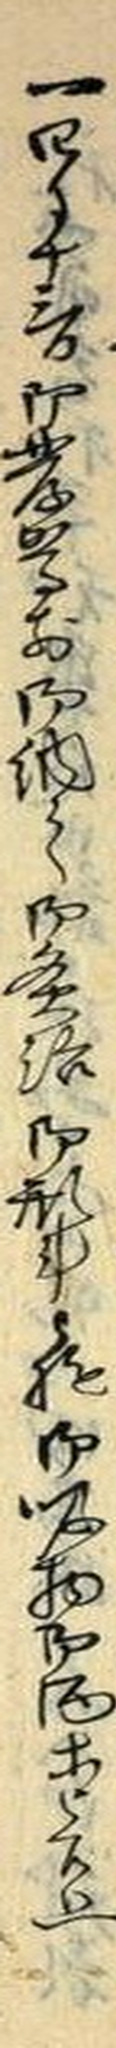一四月十三日御発駕前御納之御灸治御形斗被遊御吸物御酒等被召上
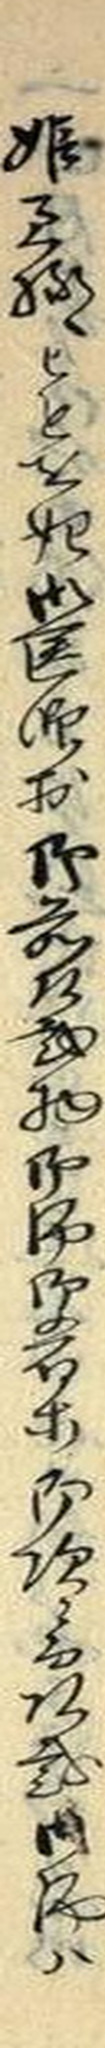姫君様へ被進を始御医師於御前頂戴物御酒御肴等御次ニ而頂戴御酒ハ
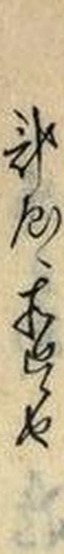部屋へ相廻候由
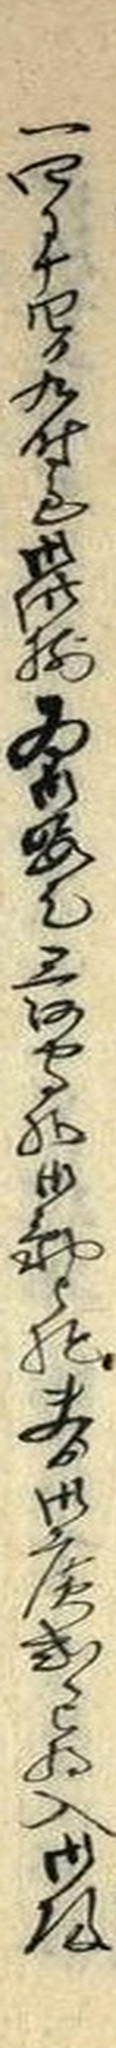一四月十四日九時過御供揃為御暇乞三河守様御勤被遊夫ゟ御広式へ被為入御帰
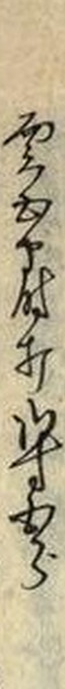殿五半時打弐寸五分
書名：少傅日録抄（斉承付側向頭取日記、在府）
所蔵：福井県文書館 Fukui Prefectural Archives
